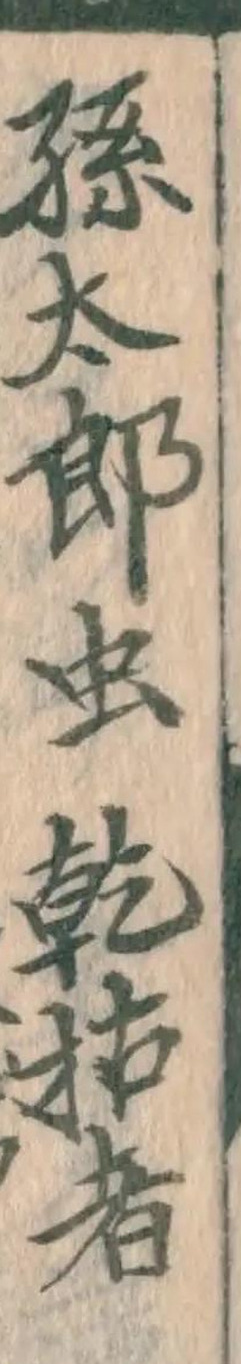孫太郎虫乾枯者
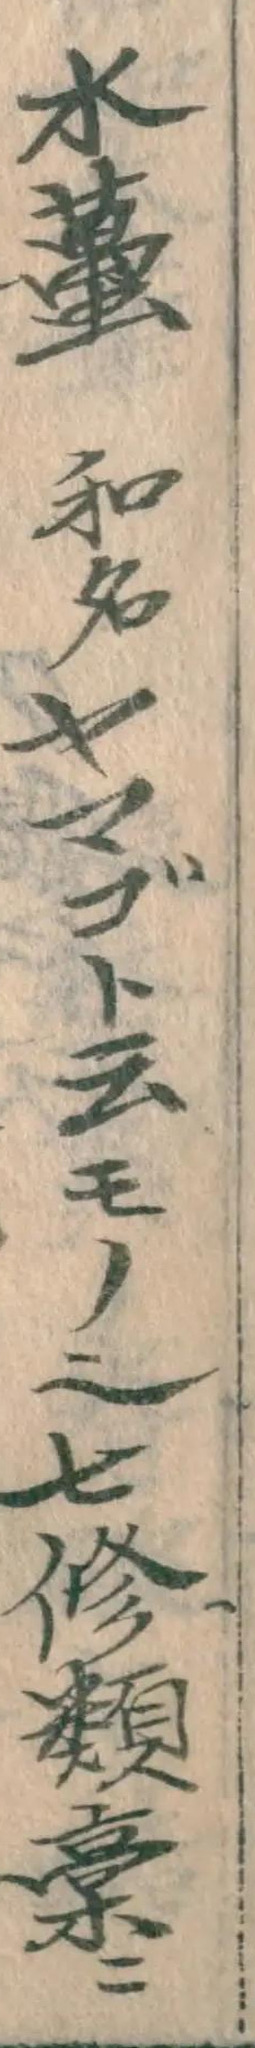水蠆和名ヤマゴト云モノ也七修類稾ニ
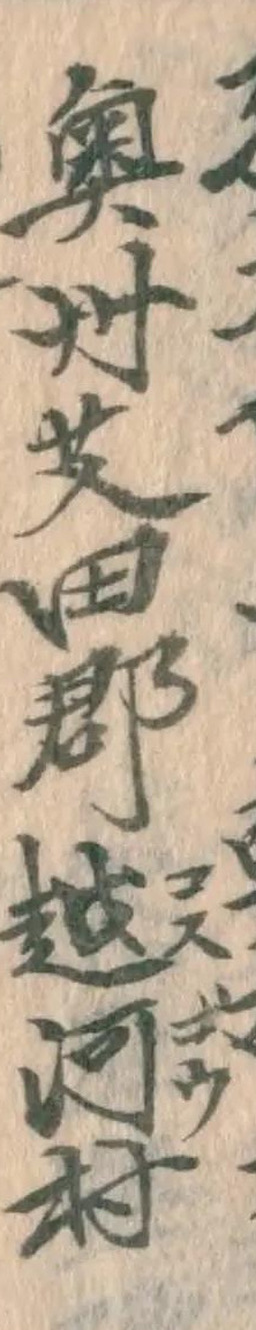奥州𦫿田郡越河村
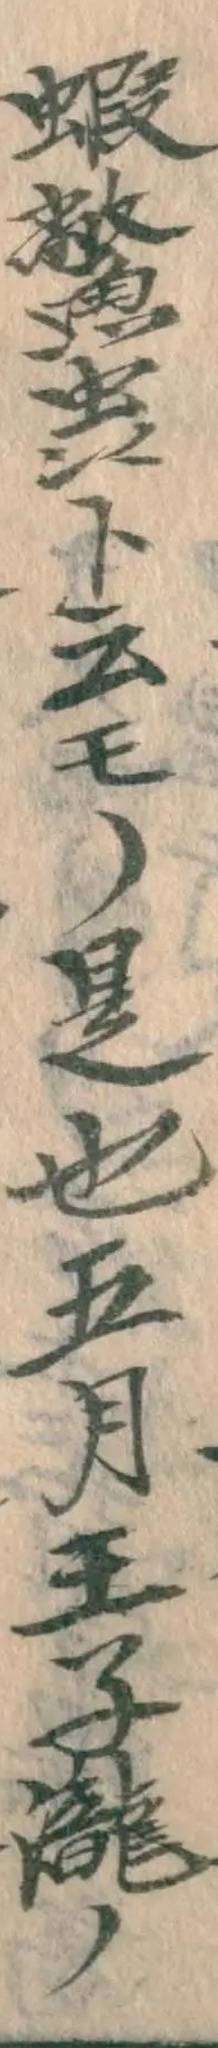蝦鱉蟲ト云モノ是也五月王子瀧ノ
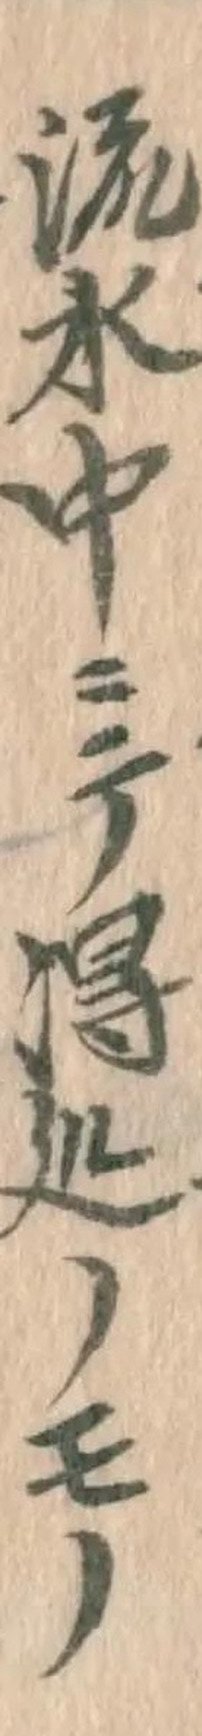流水中ニテ得処ノモノ
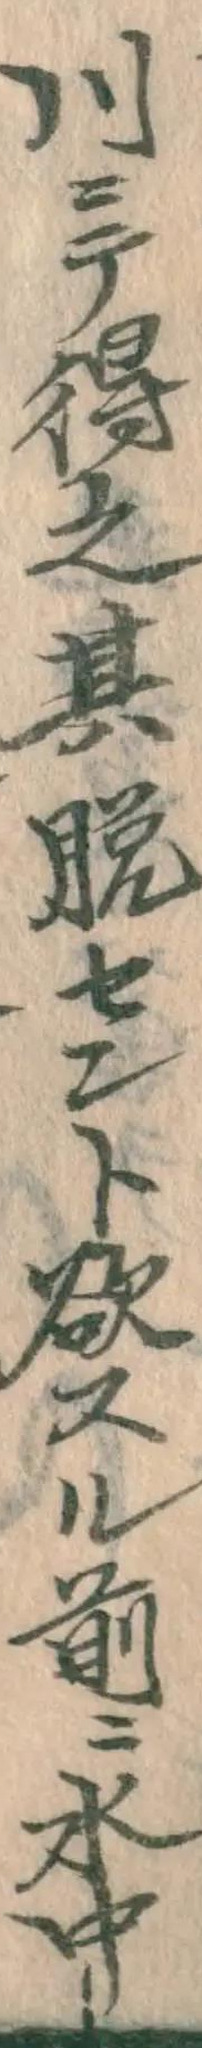川ニテ得之其脱セント欲スル前ニ水中
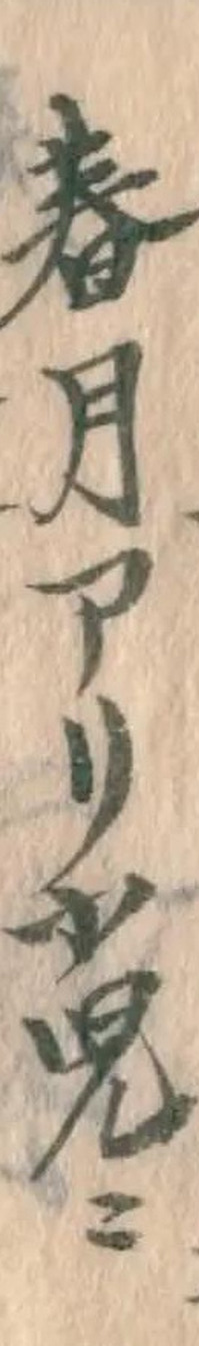春月アリ小児ニ
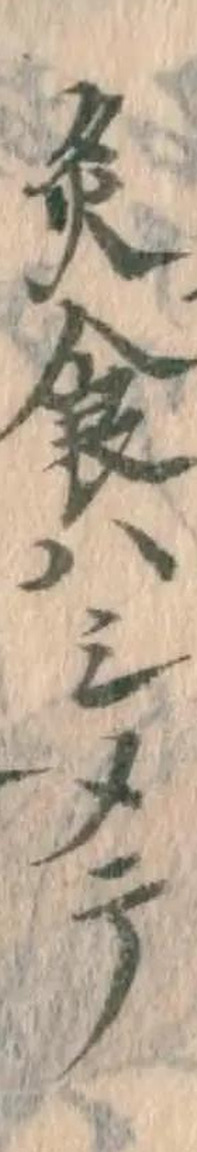炙食ハシメテ
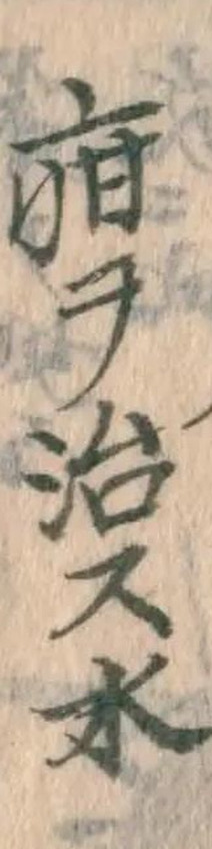疳ヲ治ス水
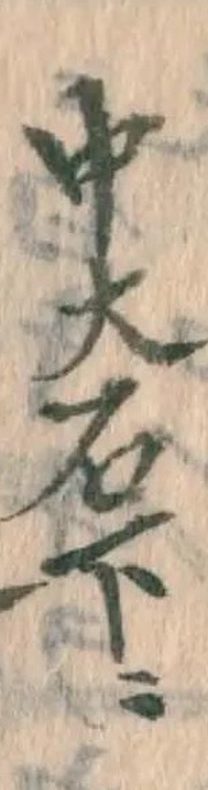中大石下ニ
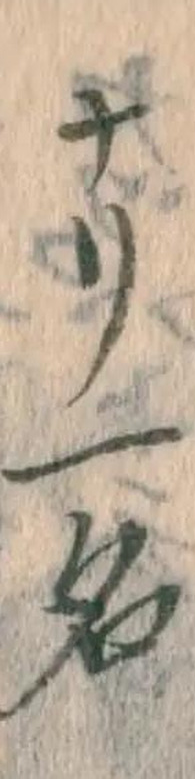ナリ一名
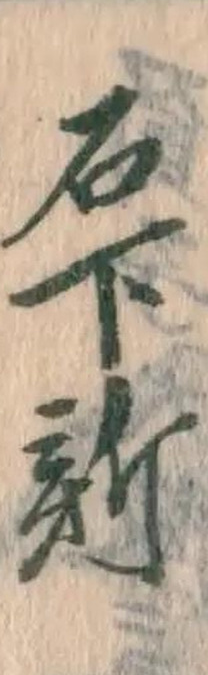石下新
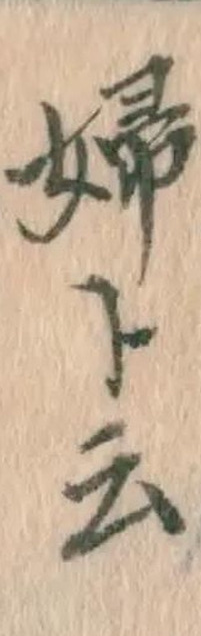婦ト云
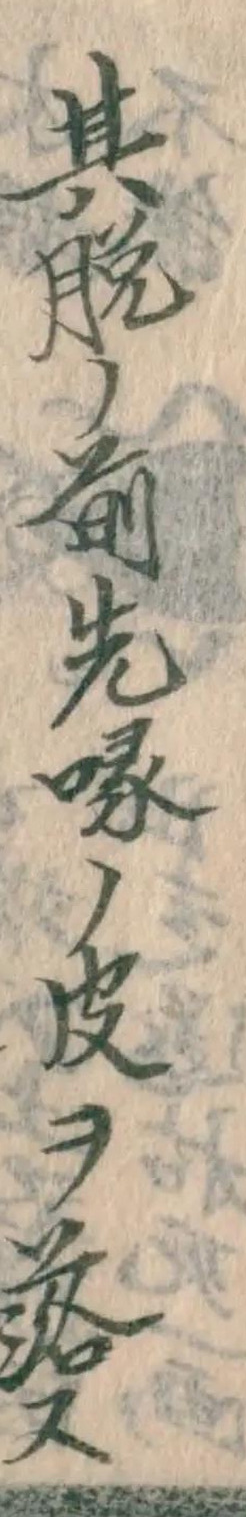其脱ノ前先㖨ノ皮ヲ落ス
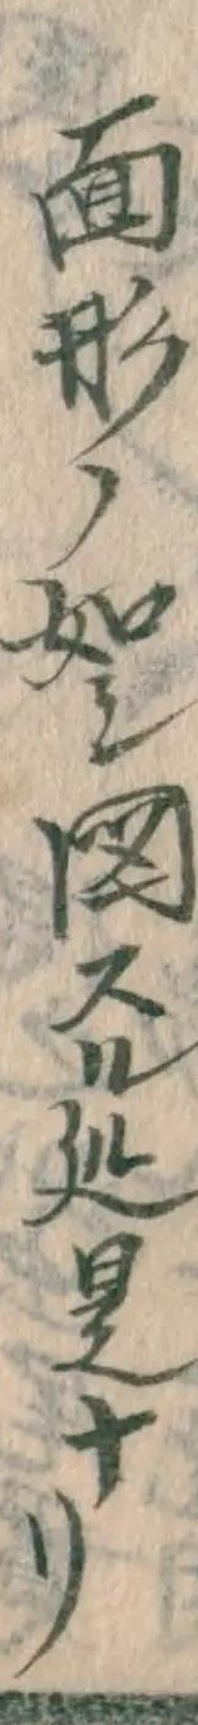面形ノ如シ図スル処是ナリ

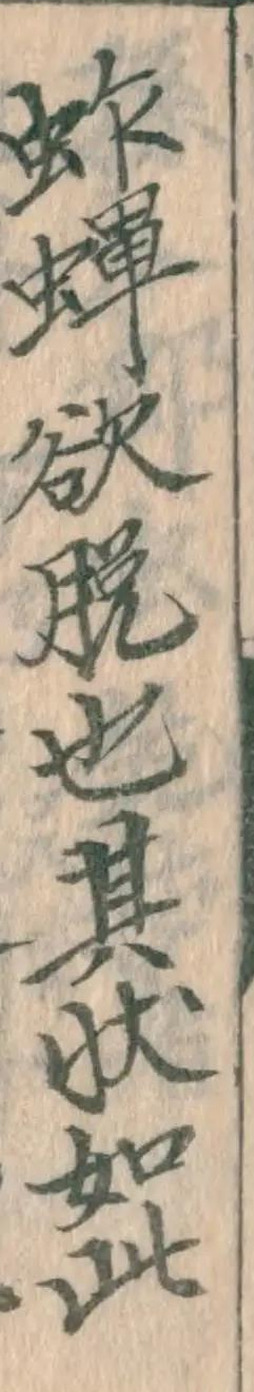蚱蝉欲脱也其状如此
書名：千蟲譜 3巻. [3]
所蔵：国立国会図書館 National Diet Library, JAPAN
